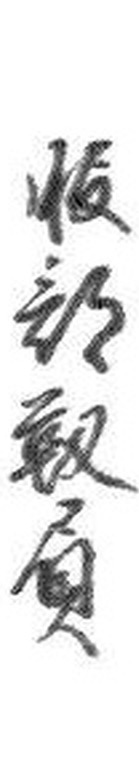服部靱負
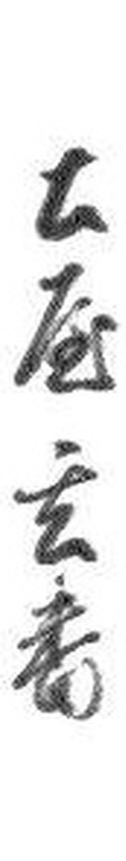土屋玄番
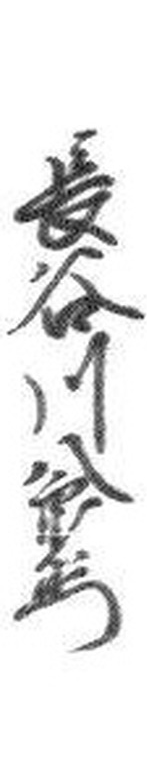長谷川八郎右衛門
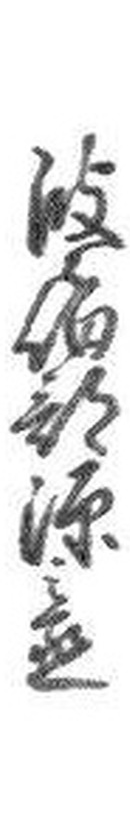波々伯部源之丞
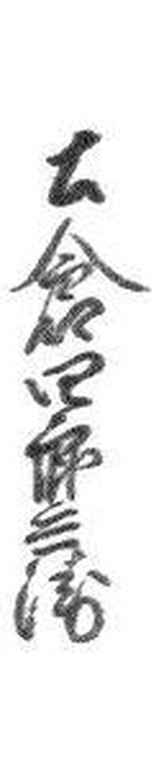土倉四郎兵衛
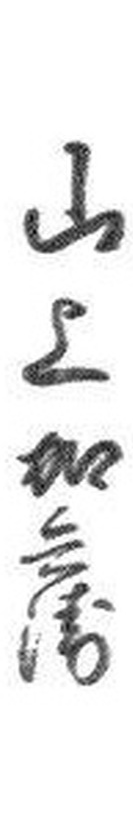山上加兵衛
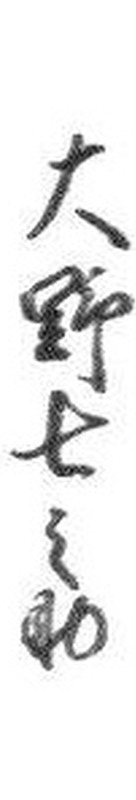大野七之助

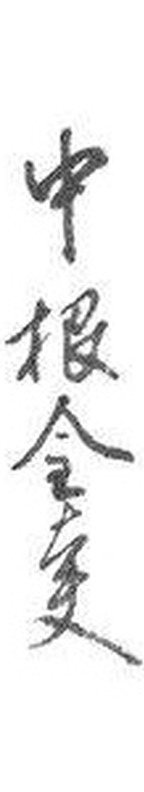中根金太夫
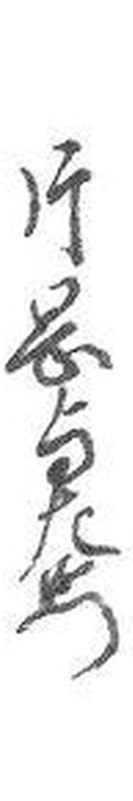片岡与左衛門
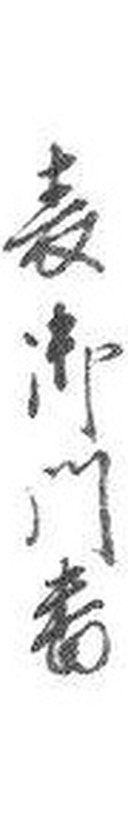表御門番
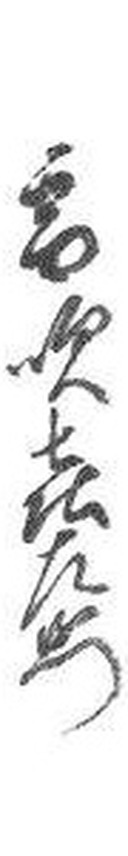香吹喜左衛門
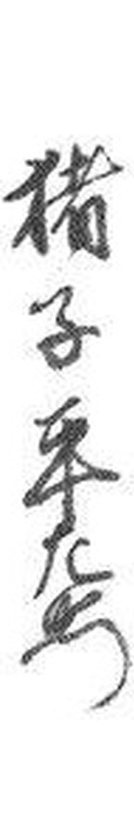猪子平左衛門
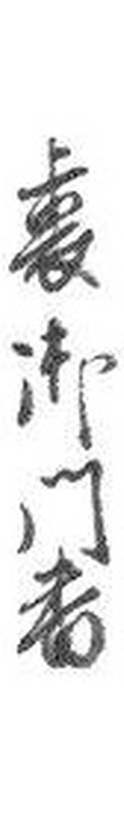裏御門番
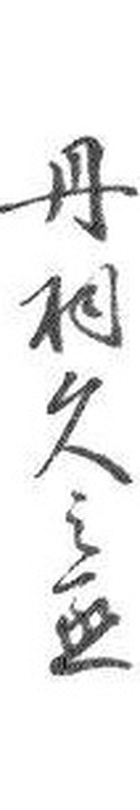丹羽久之丞
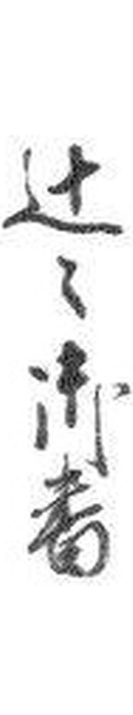辻々御番
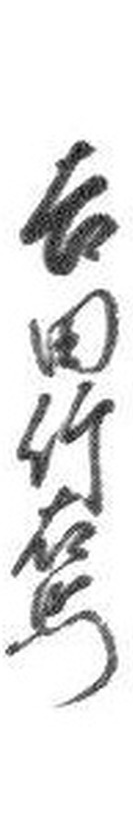吉田竹右衛門
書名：家譜 四 忠昌公 従寛永七年到正保四年
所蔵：福井県文書館 Fukui Prefectural Archives
